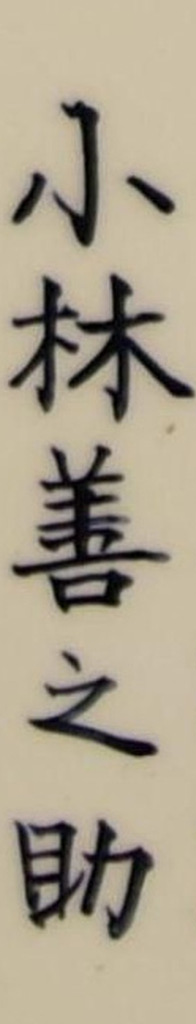小林善之助
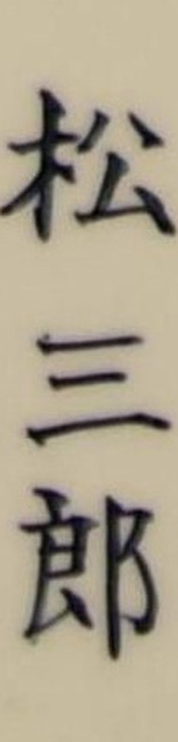松三郎
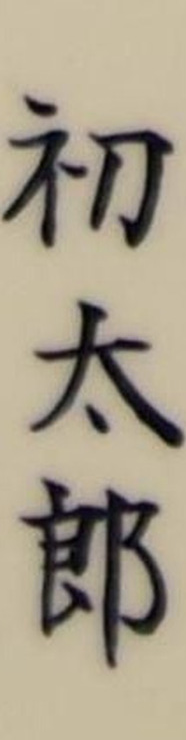初太郎
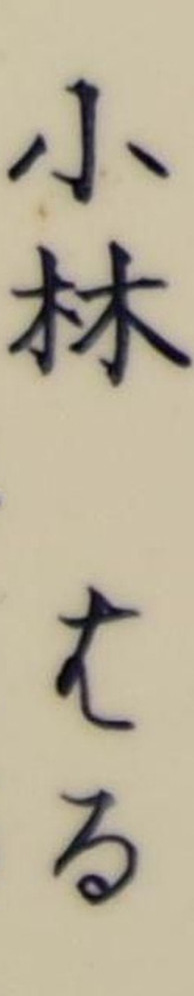小林はる
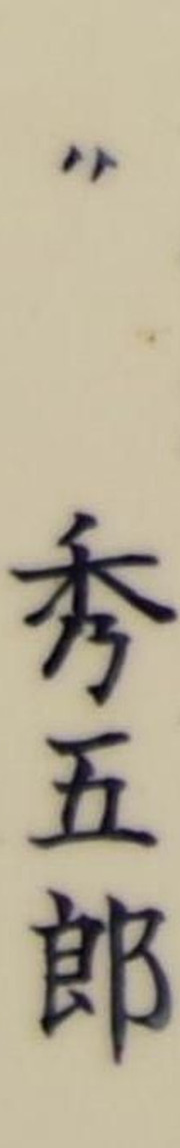秀五郎
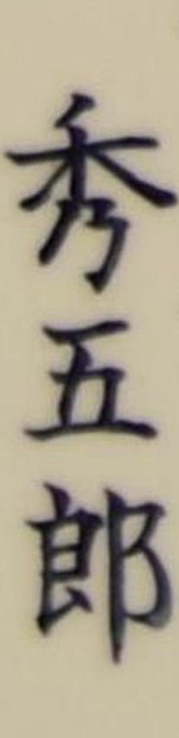秀五郎

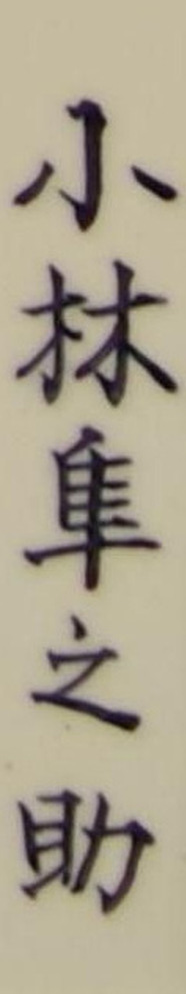小林隼之助
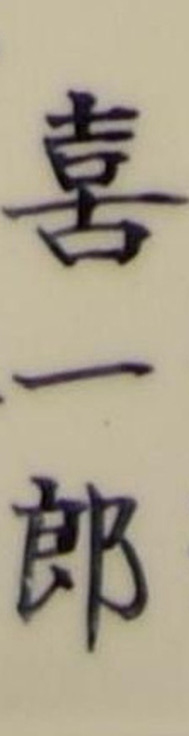喜一郎
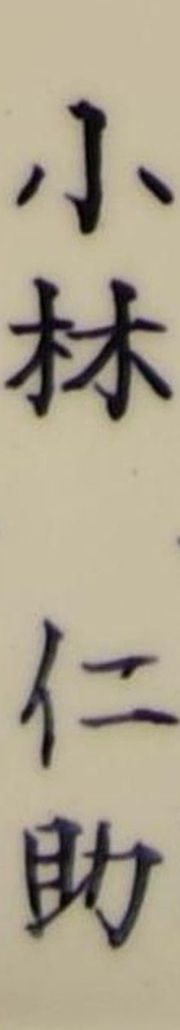小林仁助
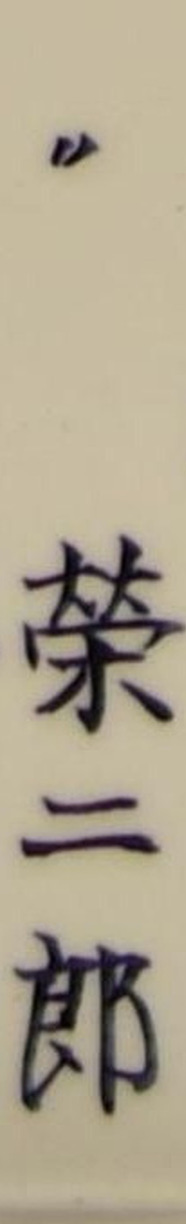榮二郎
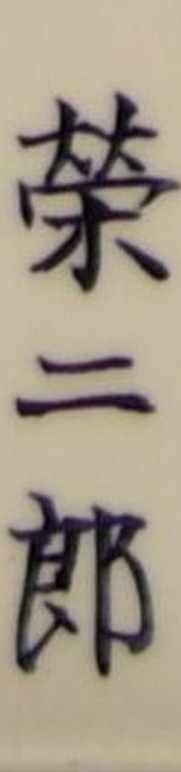榮二郎
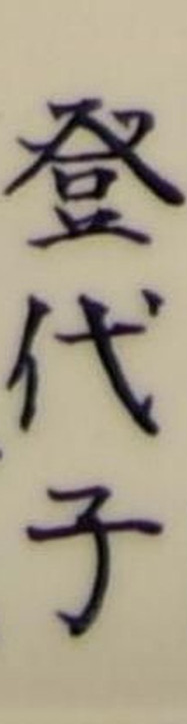登代子
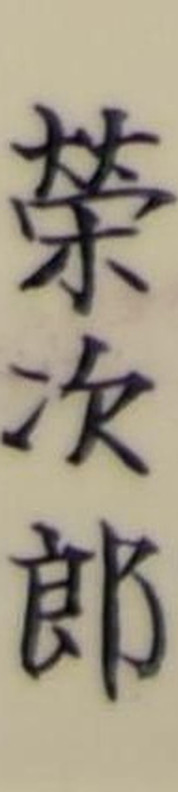榮二郎
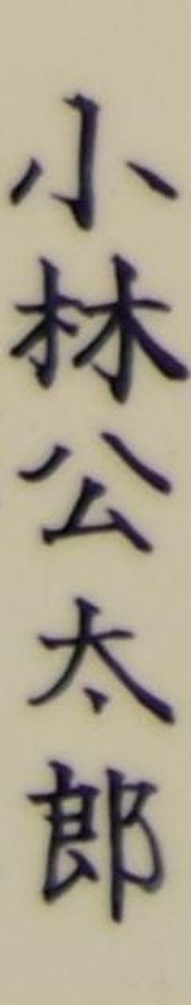小林公太郎
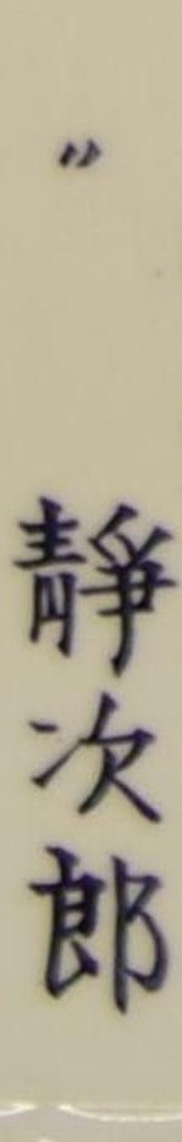静次郎
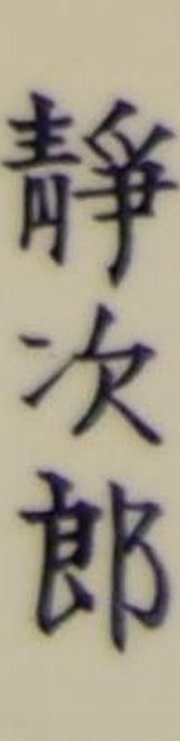静次郎
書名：A~D
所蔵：koyasan kongobuji
